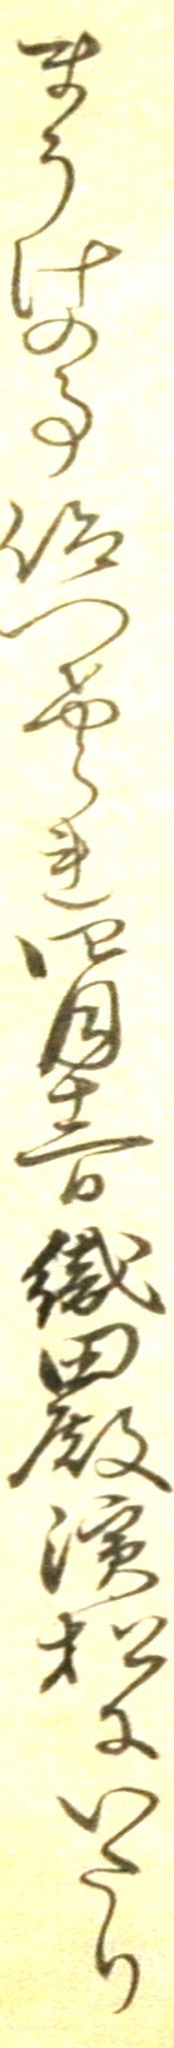まうけの事仰つけられ四月十二日織田殿浜松にいたり
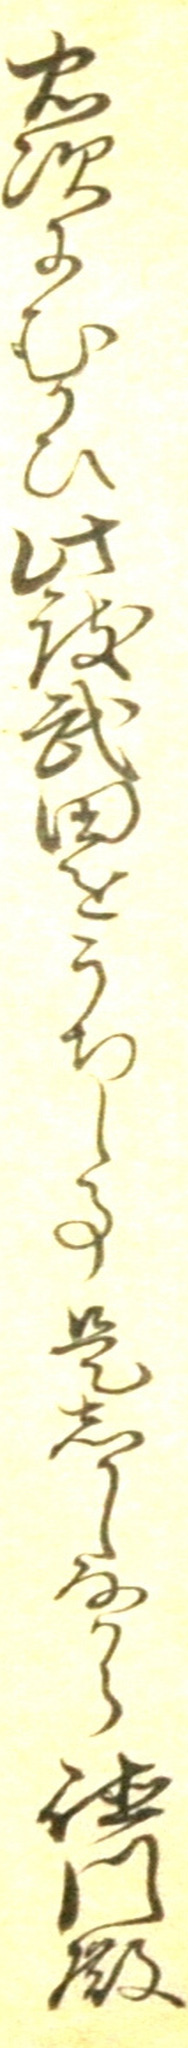忠次にむかひ此度武田をうちし事是しかしなから徳川殿
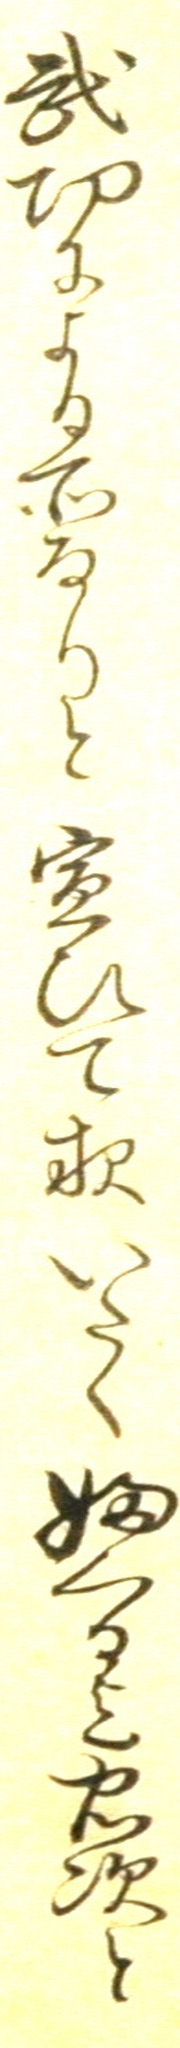武功による所なりと宣ひて夜いたくふくる迄忠次と

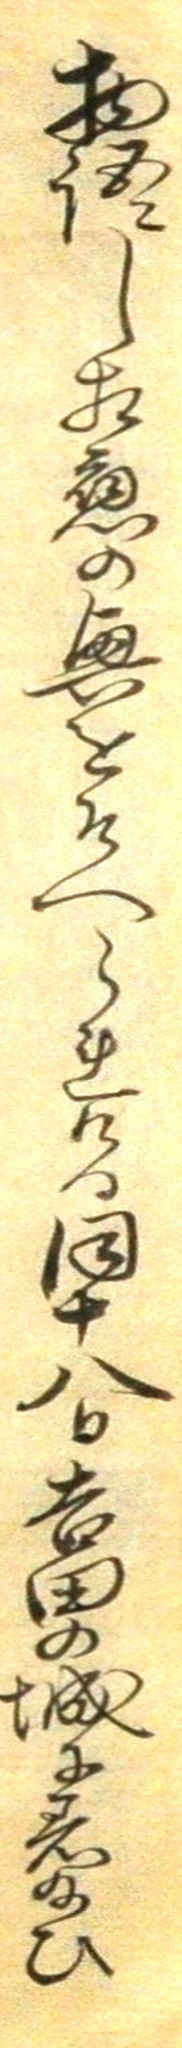物語し相応の興をそへられける同十八日吉田の城に着給ひ
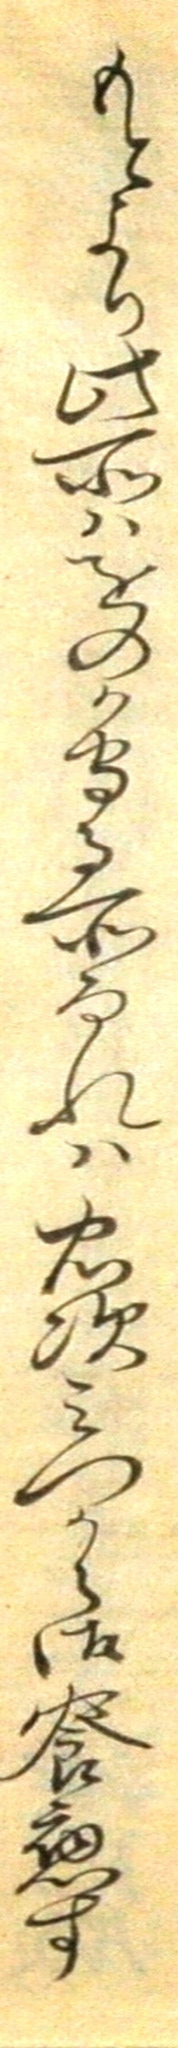もとより此所はをのか守る所なれは忠次みつから御饗応す
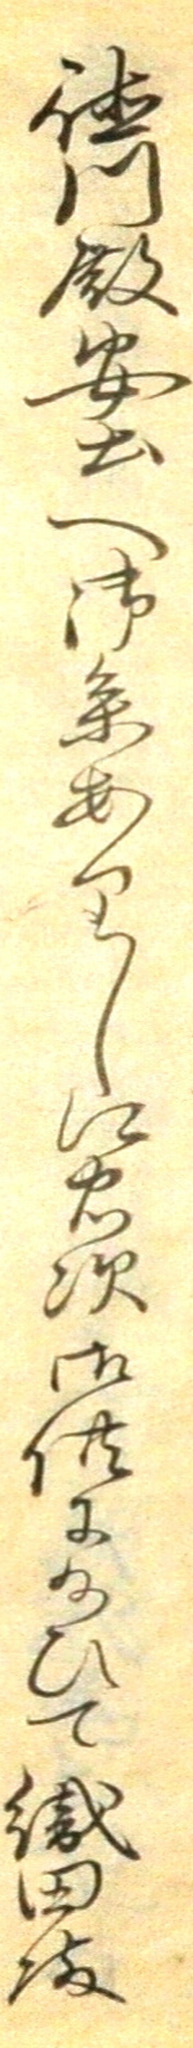徳川殿安土へ御参ありしに忠次御供に給ひて織田殿
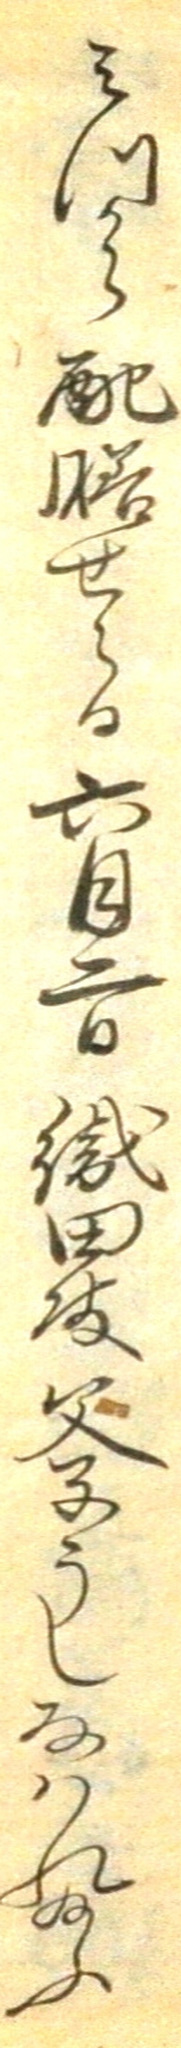みつから配膳せらる六月二日織田殿父子うしなはれ給ふ
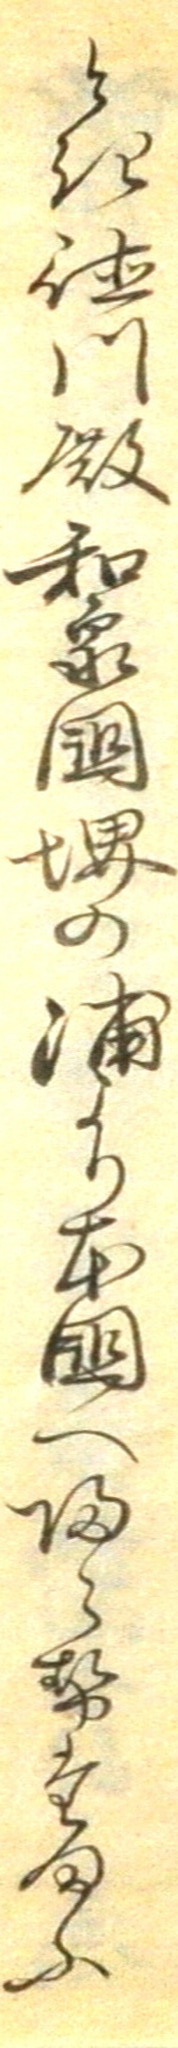とき徳川殿和泉国堺の浦より本国へ帰らせたまふ
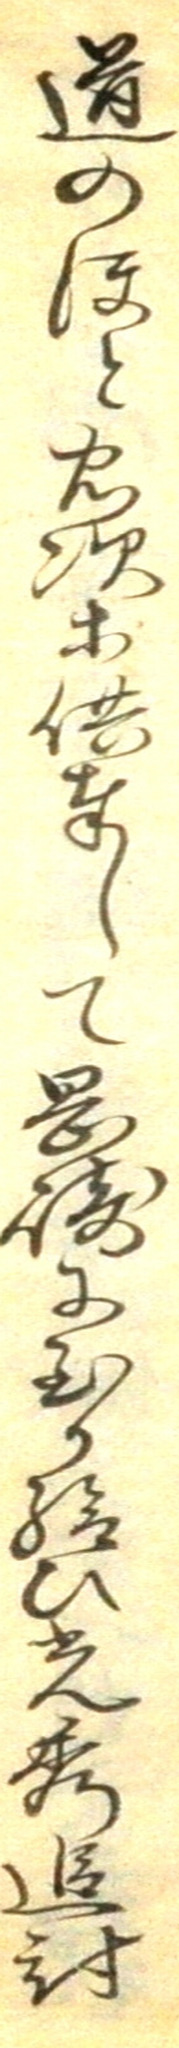道のほと忠次等供奉して岡崎に至り給ひ光秀追討
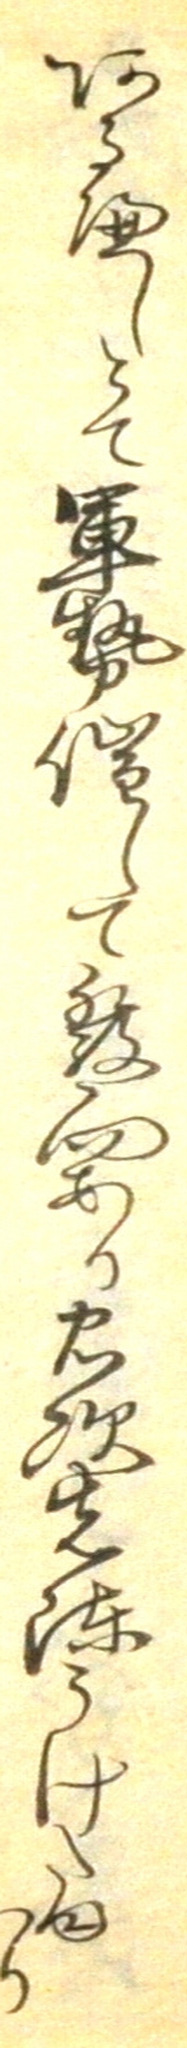あるへしとて軍勢催して発向あり忠次先陣うけたまはり
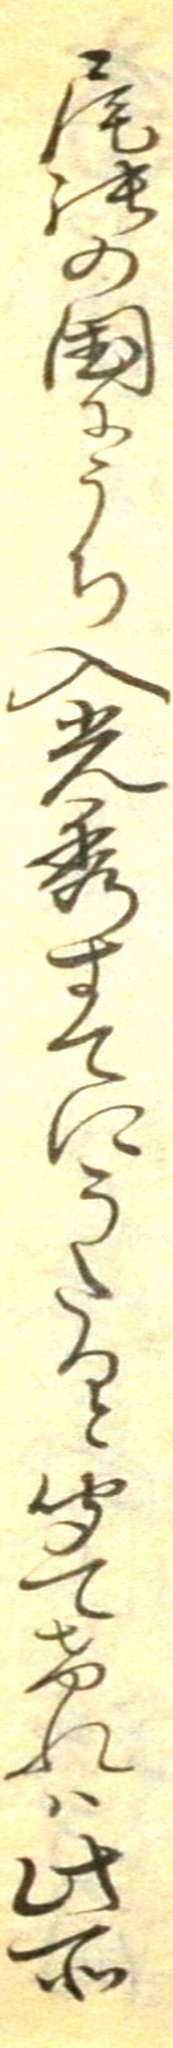尾張の国にうち入り光秀すてにうたると聞てけれは此所
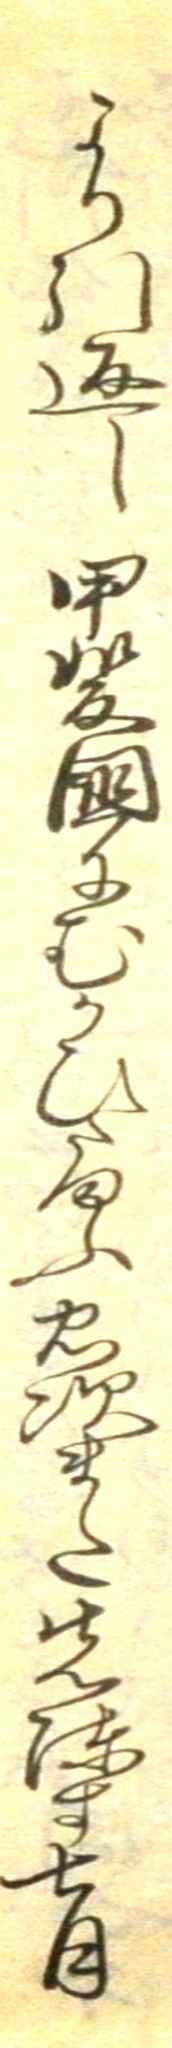より引返し甲斐国にむかひたまふ忠次また先陣す七月
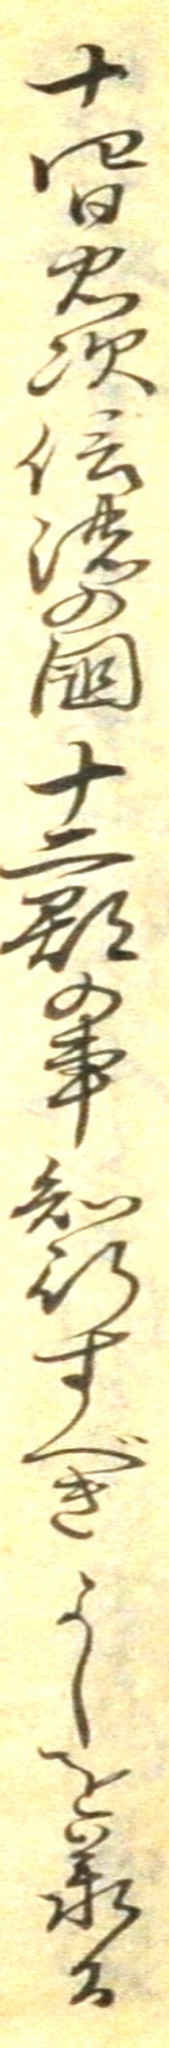十四日忠次信濃の国十二郡の事知行すべきよしを承る
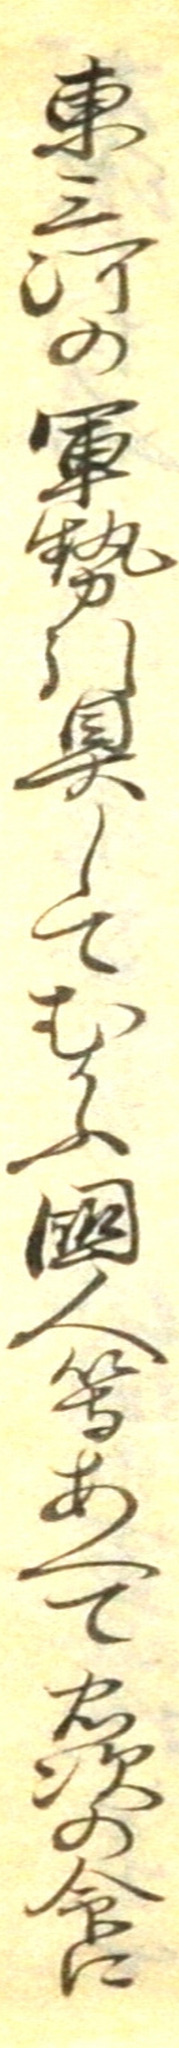東三河の軍勢引具してむかふ国人等あへて忠次の命に
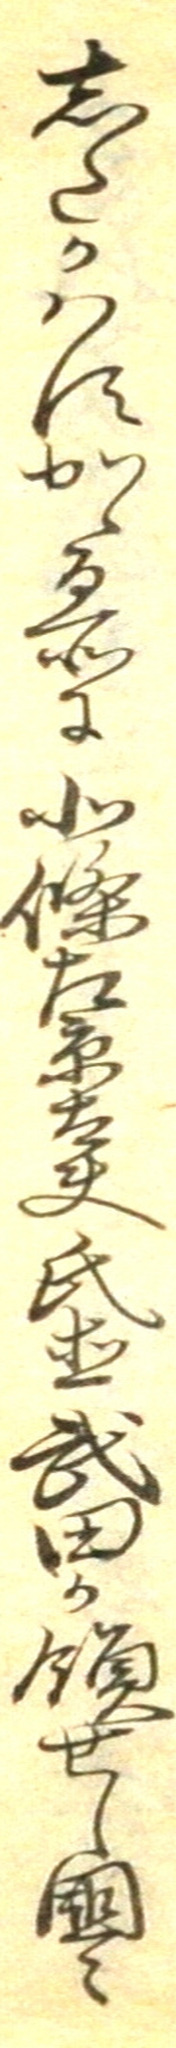したかはすかゝる所に北条左京太夫氏直武田か領せし国々
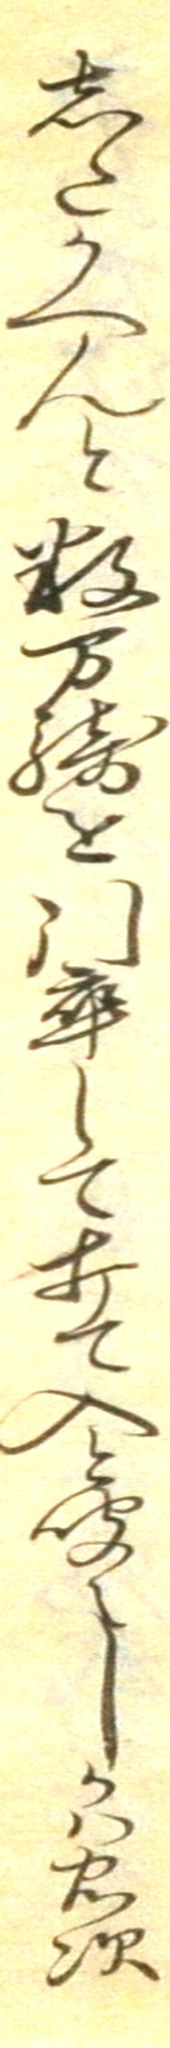したかへんと数万騎を引率して打て入と聞しかは忠次
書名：藩翰譜（四・上）
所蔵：伊那市立高遠町図書館・合同会社AMANE
